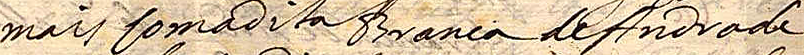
mais Com a dita Branca de Andrade
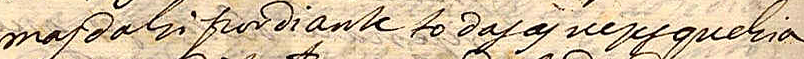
mas dahi por diante todas as uezes que hia
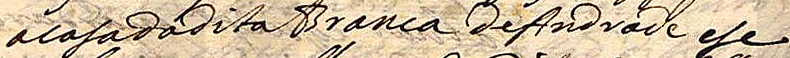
a casa da dita Branca de Andrade e se
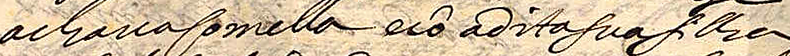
achaua Com ella e cō a dita sua filha
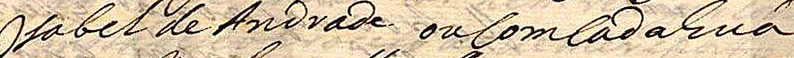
Jsabel de Andrade ou Com Cada huā
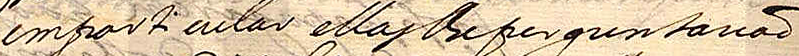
em particular ellas lhe perguntauaõ
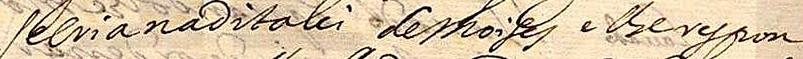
se cria na dita lei de Moises e lhe respon
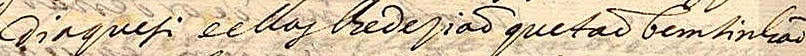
dia que si e ellas lhe deziaõ que tãobem tinhão
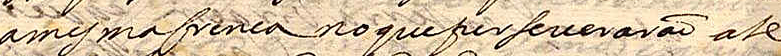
a mesma Crenca no que perseuerarão ate
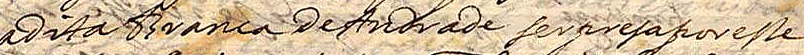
a dita Branca de Andrade ser presa por este
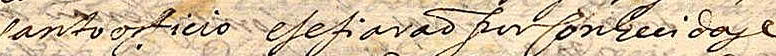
santo officio e se fiarão por Conhecidas e
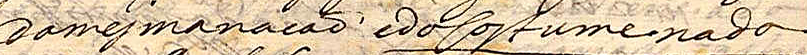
da mesma nacaõ e do Costume nada
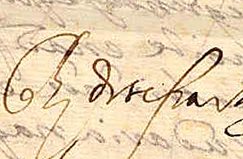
Rz de se fiar
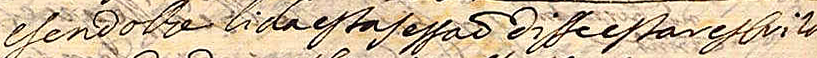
e sendolhe lida esta sessaõ disse estar esCrita
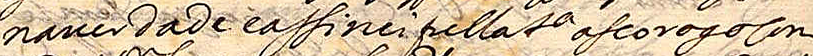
na uerdade e assinei pella ta a seo rogo Com
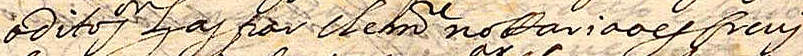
o dito sor Gaspar clemte nottario o esCreuj
